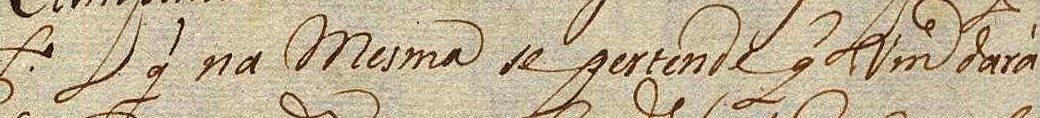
f.o q̄ na mesma se pertende q̄ V mce dará
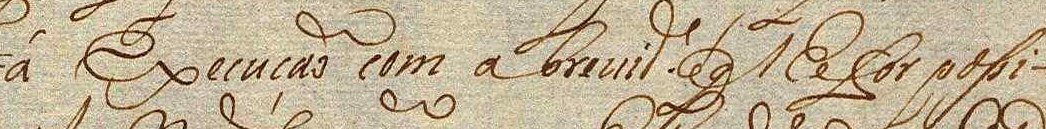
á Execuçaõ com a breuide q̄ lhe for possi
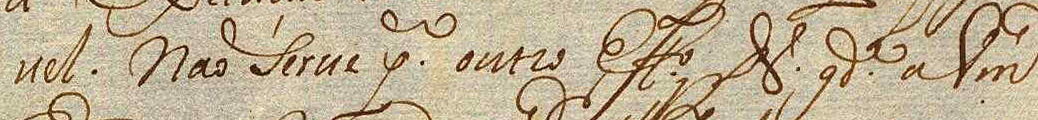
uel. naõ serue p.a outro Eff.o Ds. gd.e a V m.ce
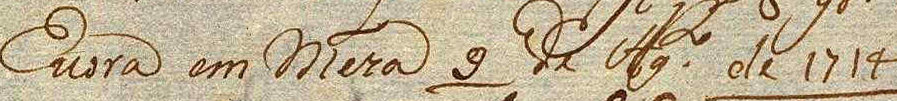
Euora em meza 9 de Ag.to de 1714
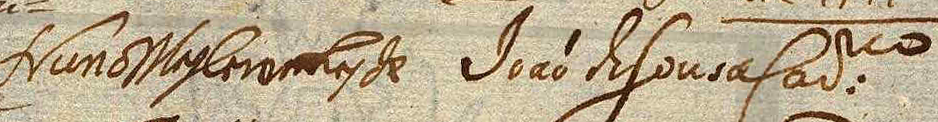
Nuno MasCarenhas de Ioaõ de sousa Car.o
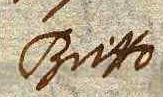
Britto
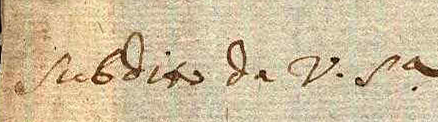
subdito da V. s.a
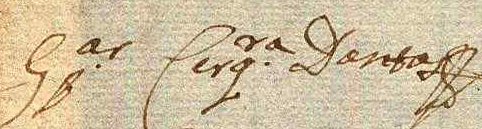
Gp.ar Cerq.ra Danta
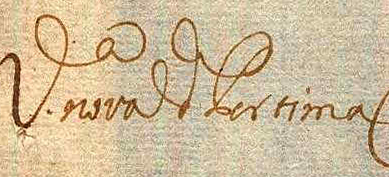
V.a nova d̄ Portimā
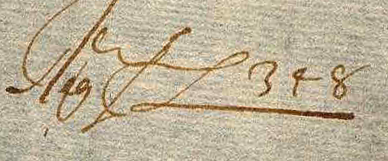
Reg.a fL348
